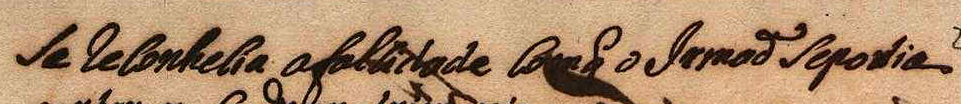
se ReConhecia a falcidade Com q̄ o Irmaõ se podia
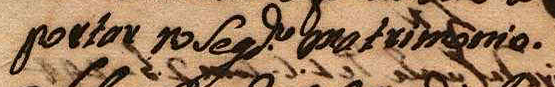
portar no seg.do matrimonio.
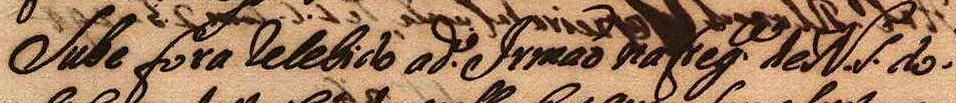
Sabe fora Recebido o d.o Irmaõ na freg.a de N. S. do
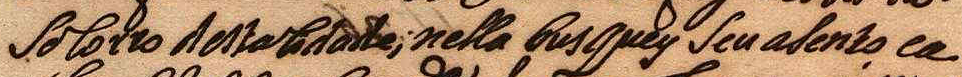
SoCorro desta Cidade; nella busquey seu asento, e a
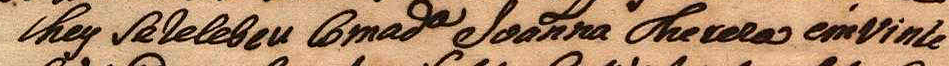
chey se Recebeu com a da Ioanna Thereza em vinte
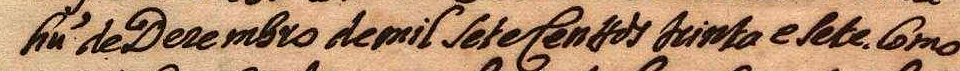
hū de Dezembro de mil seteCenttos trinta e sete. Como
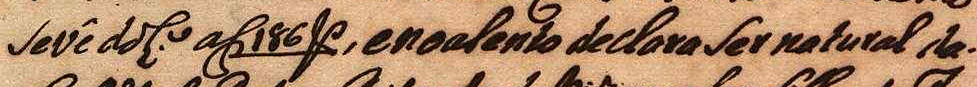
se vê do L.o a fl 186 V̄o, e no asento declara ser natural da
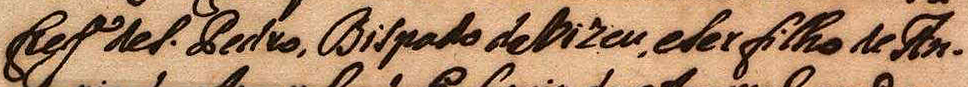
frega de S. Pedro, Bispado de Vizeu, e ser filho de An
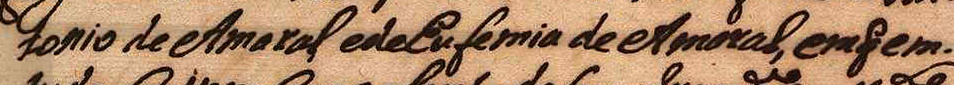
tonio de Amaral e de Eufemia de Amaral, em q̄ em
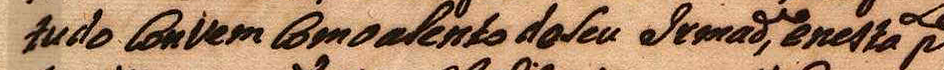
tudo Convem Com o asento do seu Irmaõ, e nesta p.te
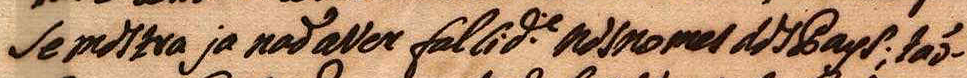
se mostra ja naõ aver falcid.e nos nomes dos Pays; taõ
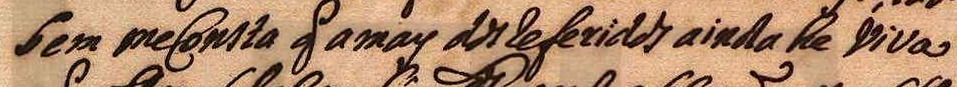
bem me Consta q̄ a may dos Referidos ainda he viva
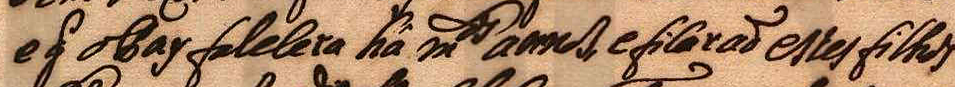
e q̄ o Pay falecera há mtos annos, e ficaraõ estes filhos
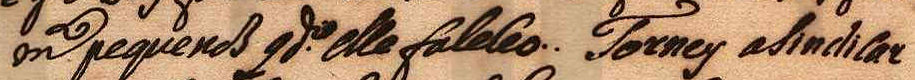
mto pequenos qd.o elle faleCeo. Torney a sindicar
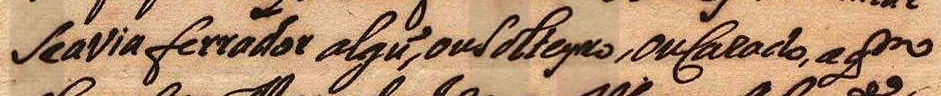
se avia ferrador algū, ou solteyro, ou Cazado, a qm
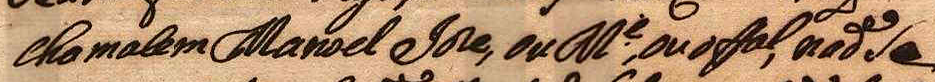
chamacem Manoel Ioze, ou M.e, ou offal, naõ se
